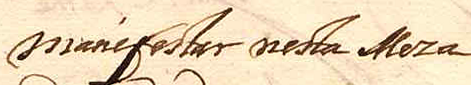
manifestar nesta Meza?
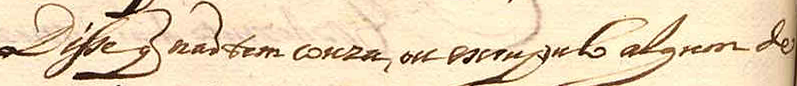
Disse q̄ naõ tem couza, ou escrupulo algum de
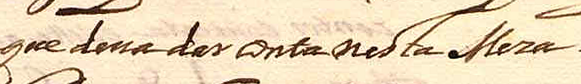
que deua dar conta nesta Meza.
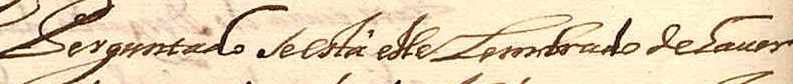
Perguntado se está elle Lembrado de hauer
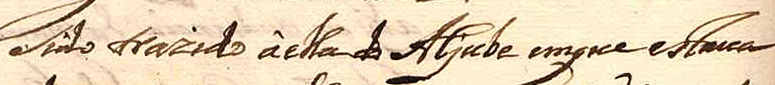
sido trazido à ella do Aljube em que estaua
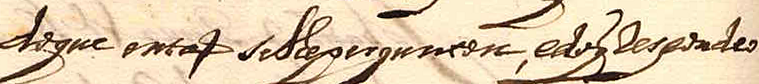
do que entaõ se lhe perguntou, e do q̄ Respondeo?
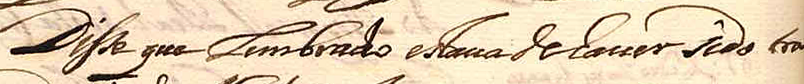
Disse que Lembrado estaua de hauer sido tra
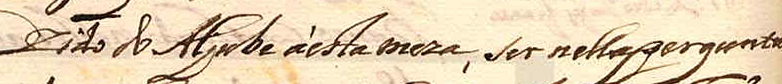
Zido do Aljube à esta meza, ser nella pergunta
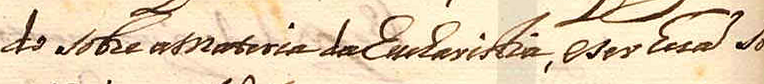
do sobre a materia da Eucharistia, e ser huā só
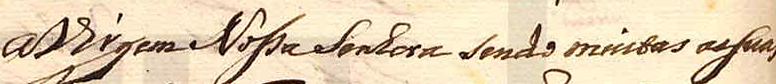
a Virgem Nossa Senhora sendo muitas as suas
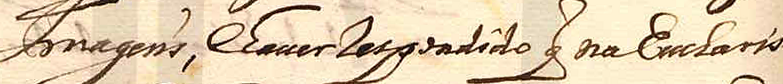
Imagens, e hauer Respondido q̄ na Eucharis
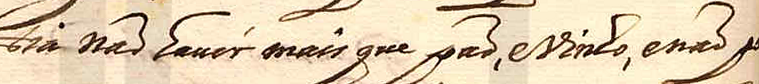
tia naõ hauer mais que paõ, e vinho, e não po
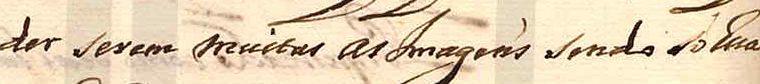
der serem muitas as Imagens sendo só huā
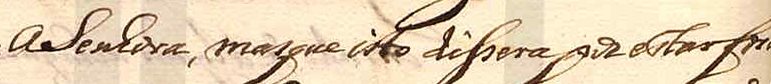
a Senhora, mas que isto dissera por estar fora
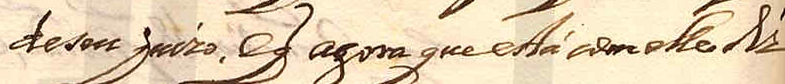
de seu juizo, e q̄ agora que está com elle diz
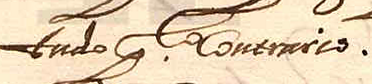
tudo p.lo contrario.
